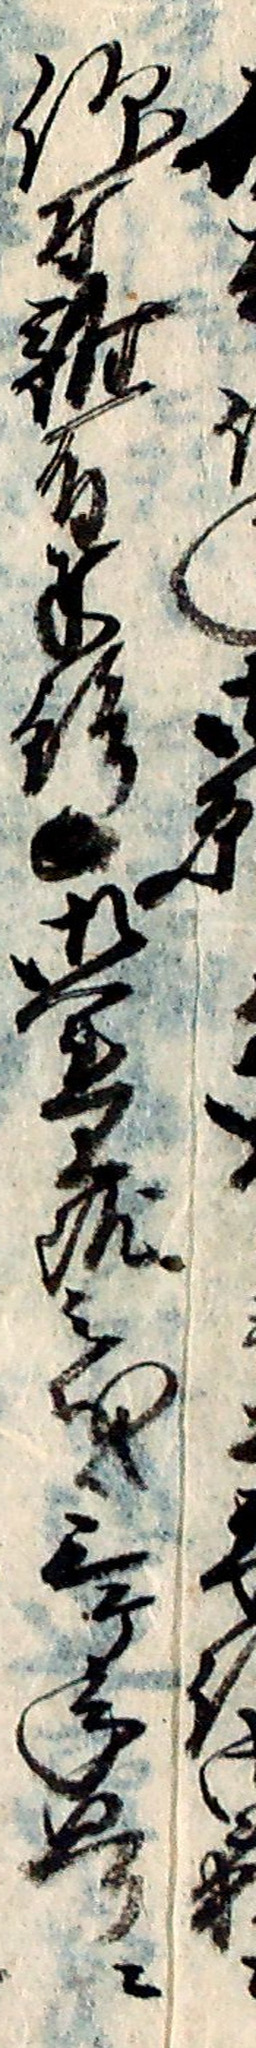仰付難有奉預り候御運上銀之義は三ヶ年廻りに
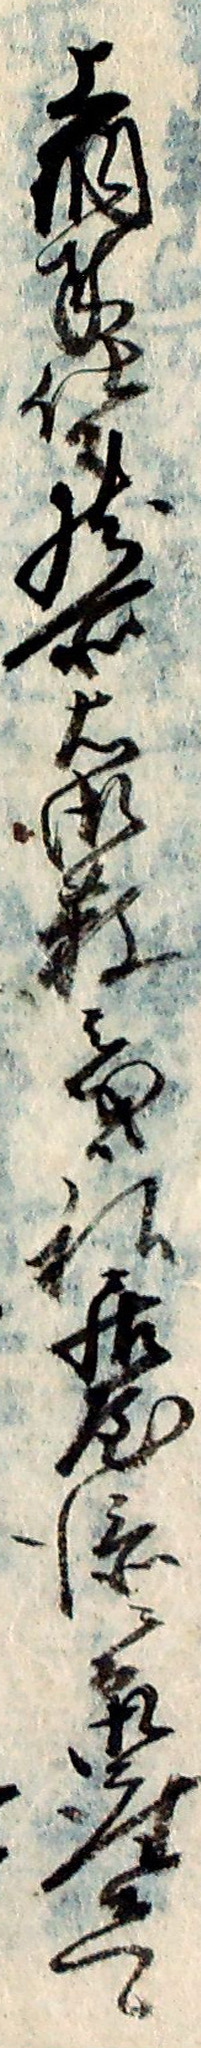上納奉仕候然所右御藪之義は私居屋添にて御座候へは
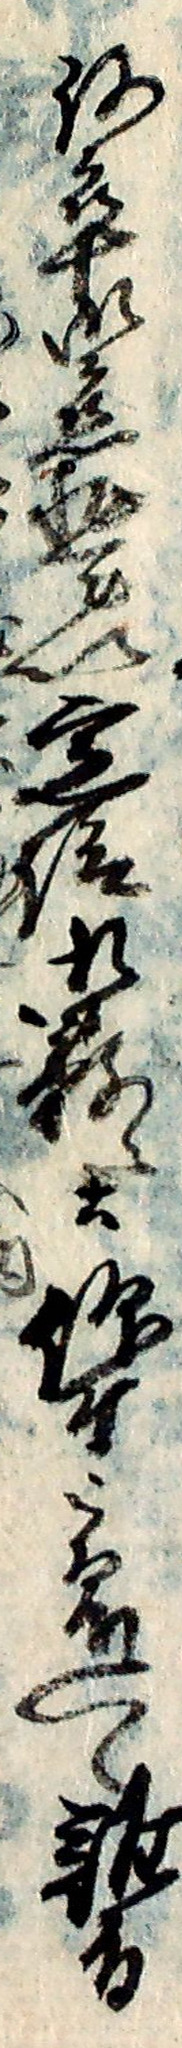何卒御慈悲を以定請御藪にて被仰付被為下候はゝ難有
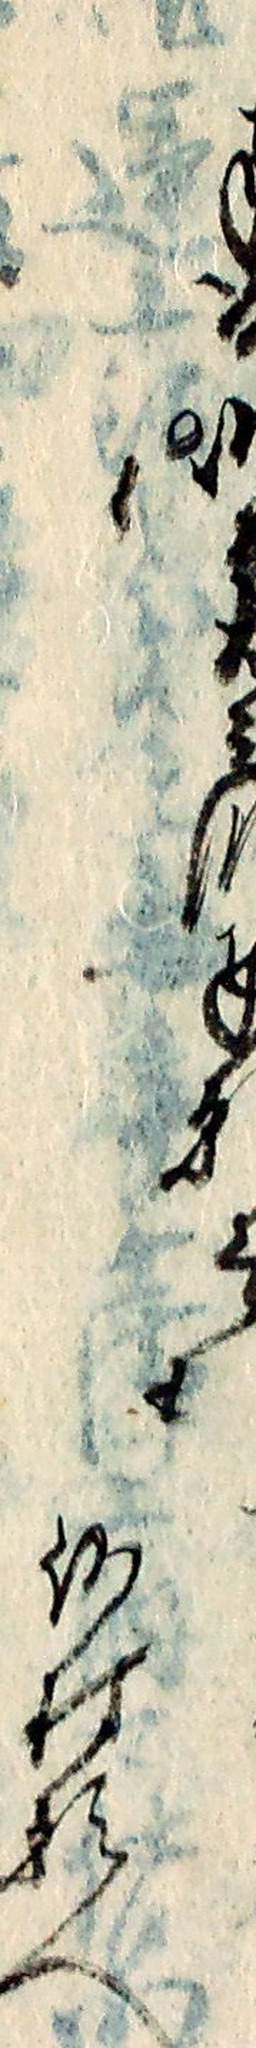何村願人
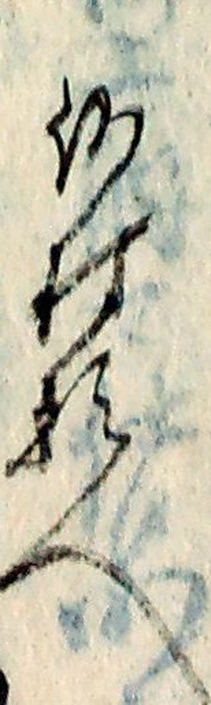何村願人
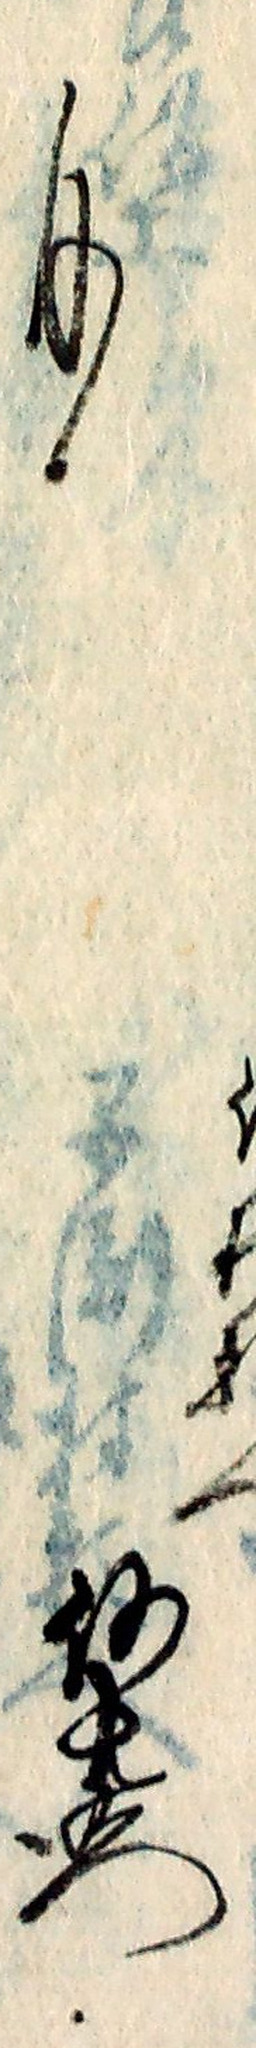何右衛門
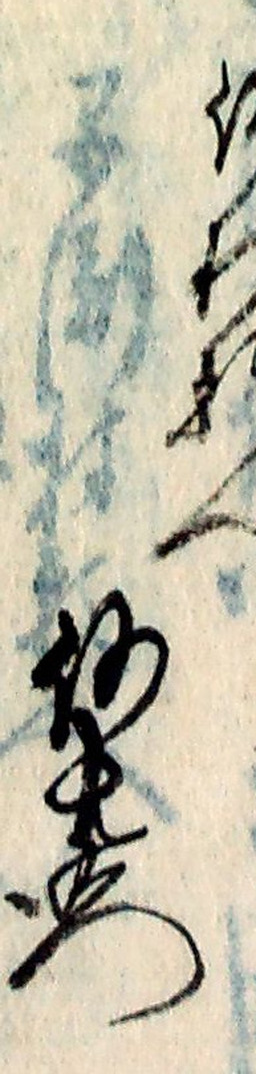何右衛門
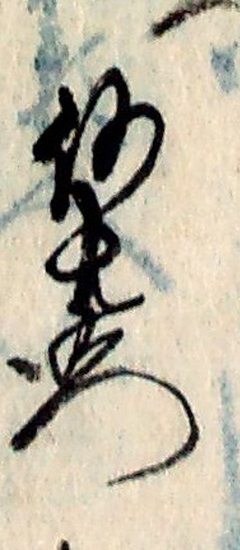何右衛門
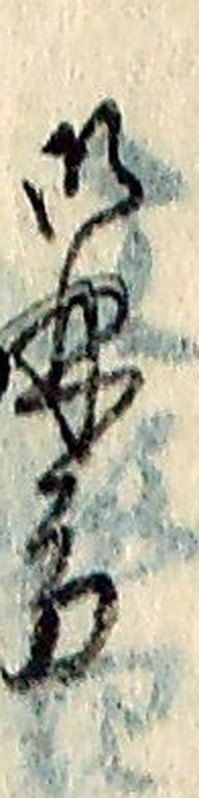御林方
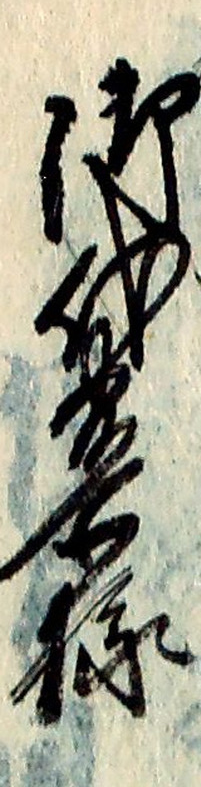御代官所様
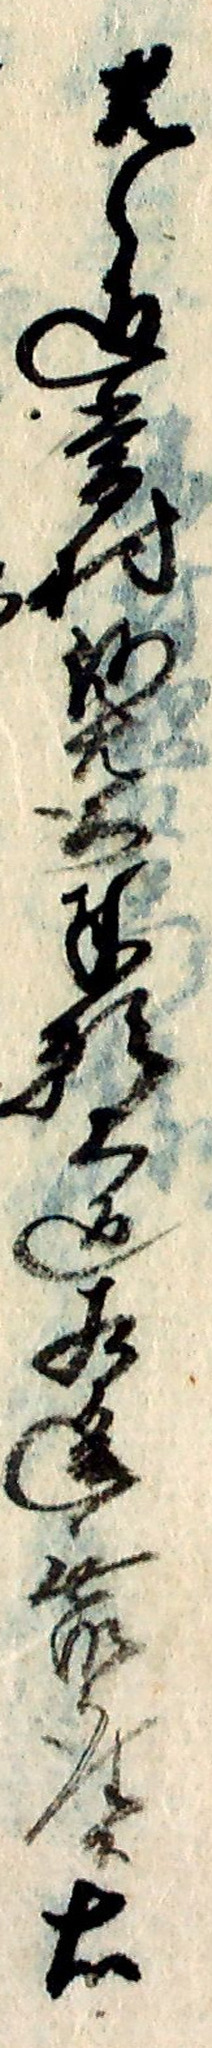右之通当村何右衛門奉願上通相違無御座候右
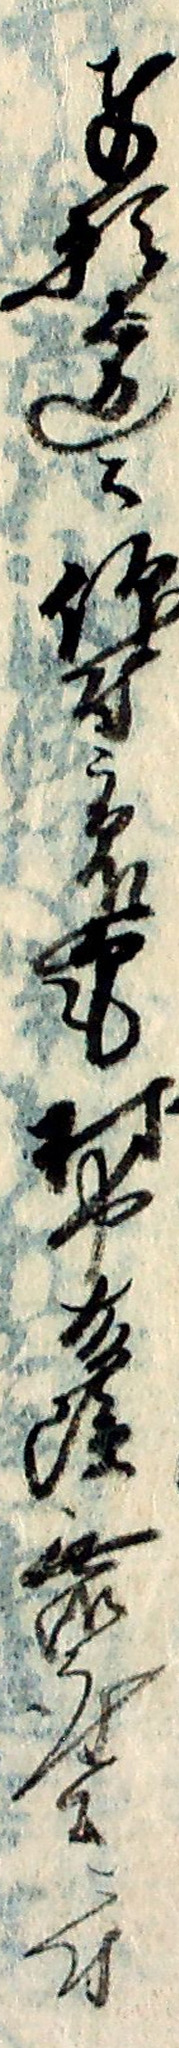奉願上通被仰付被為下候ても村中故障無御座候に付
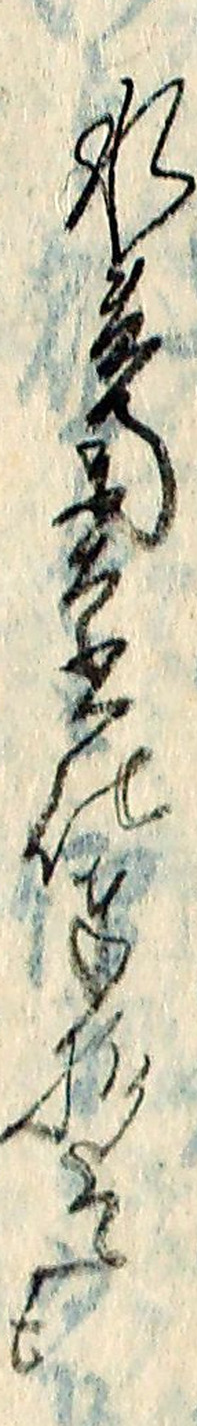私共奥書仕奉指上候以上
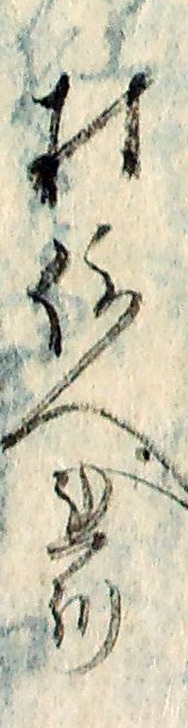村役人連判
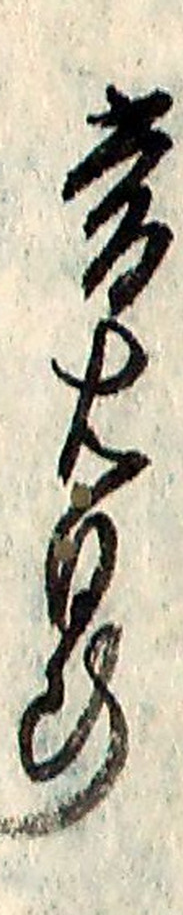当右同断

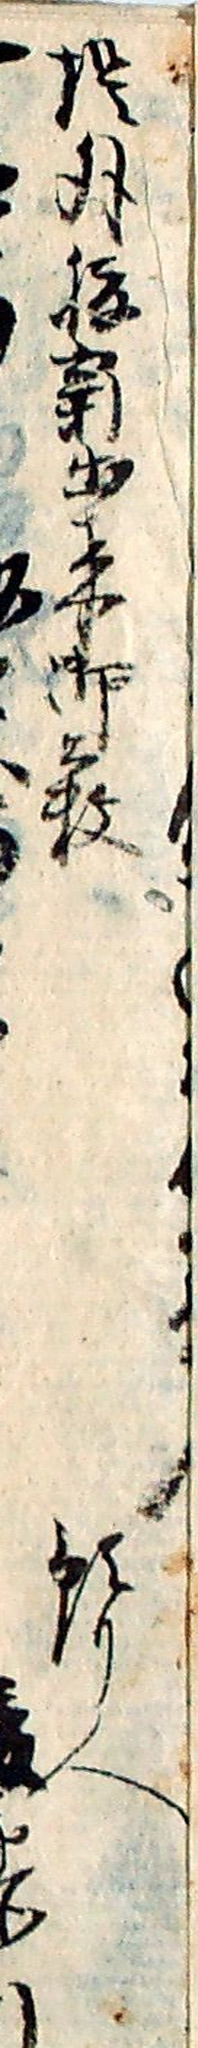堤外腹新出来御藪預り人
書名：諸御願書控(後藤氏壱番）
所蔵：鳴門教育大学 Naruto University of Education
